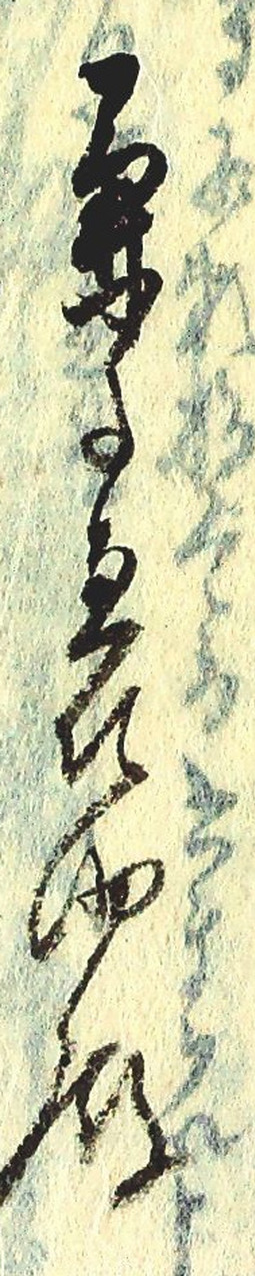兼子恵次助殿

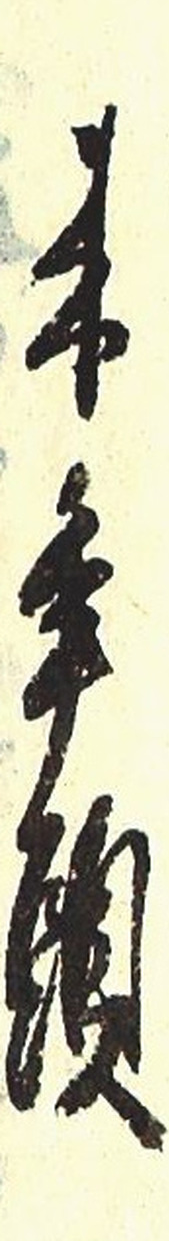来年頭
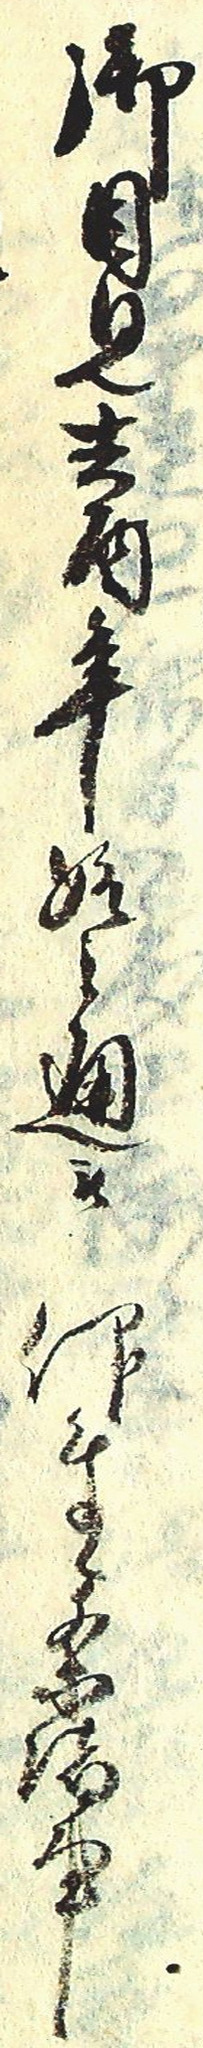御目見去酉年始之通被仰付候条諸事
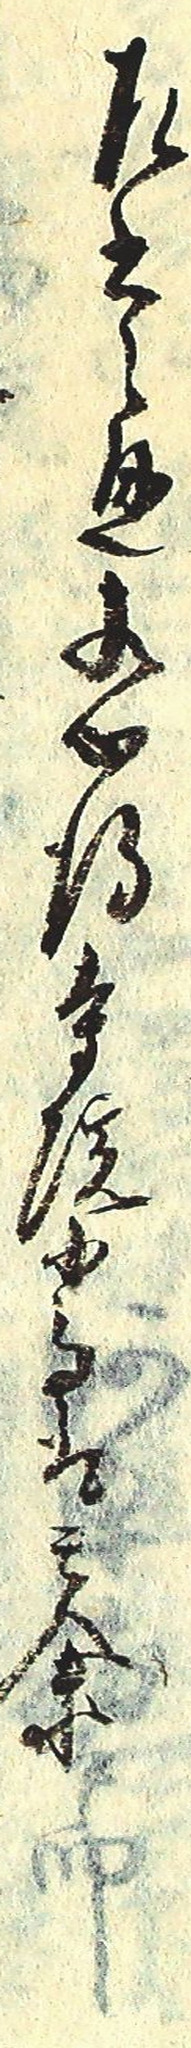左書之通相心得寺院小高取其余
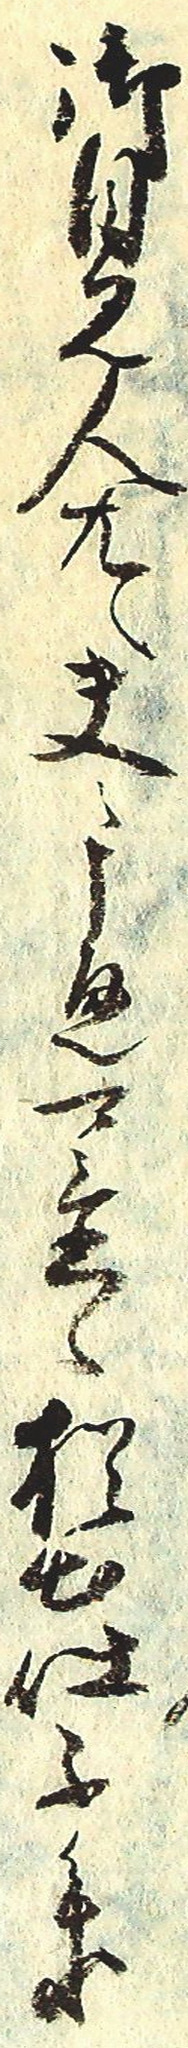御目見人共へ夫々申通可置候猶出仕不参
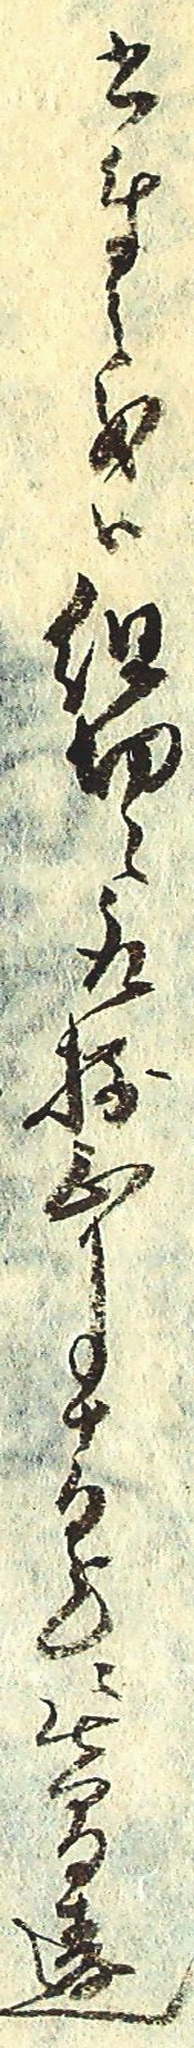書付之義は組切に取揃正月十日迄に無間違
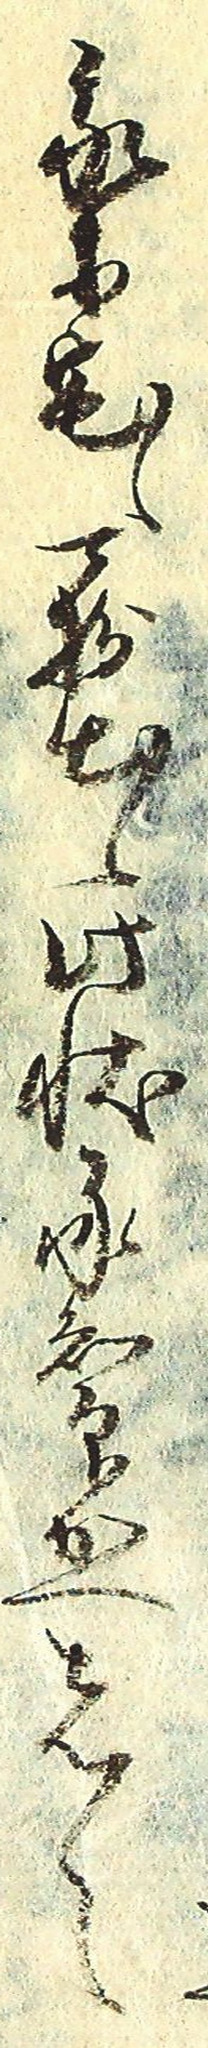我等宅へ可指出候此状承知印加へ先々
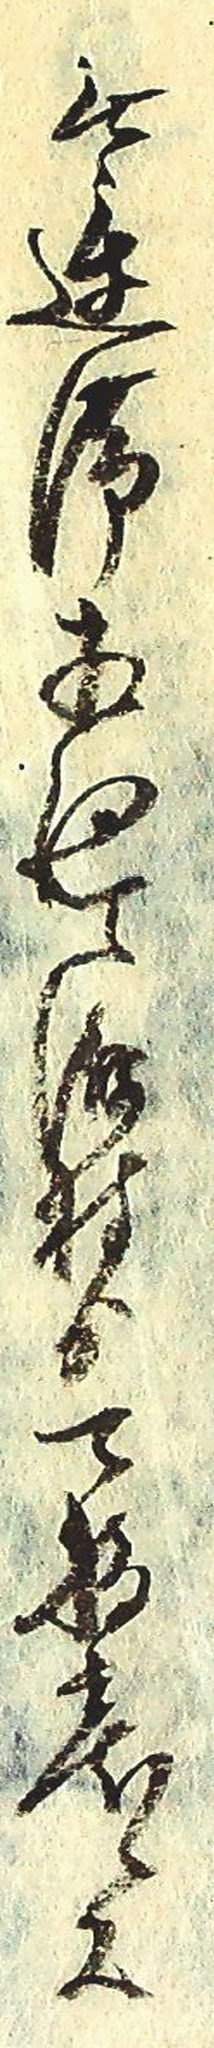無遅滞相廻し済村ゟ可指戻候以上
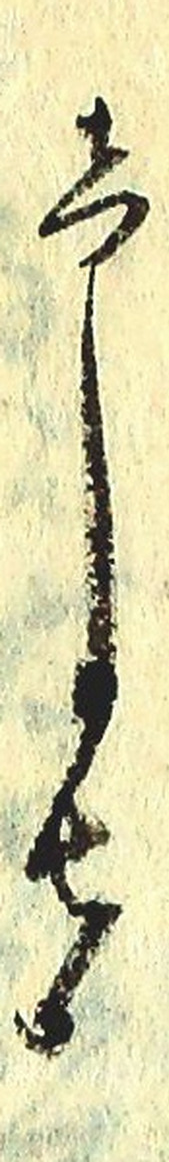十二月七日
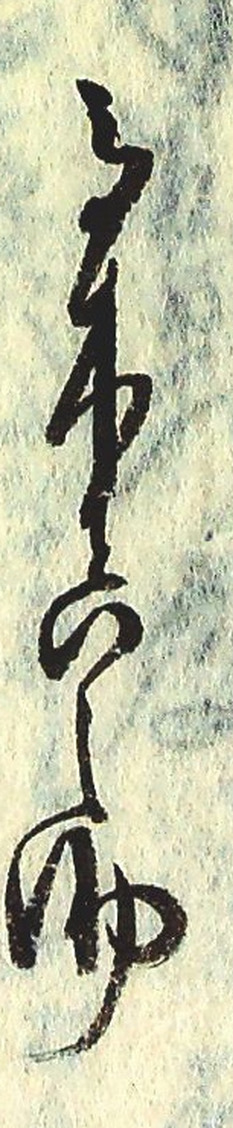高木真之助
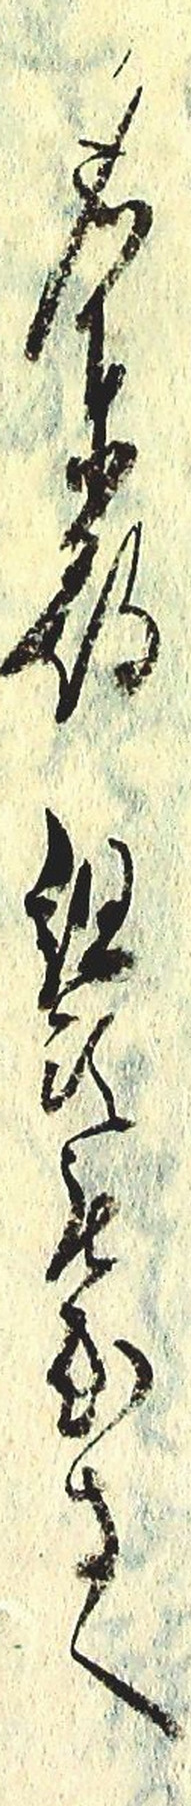名東郡組頭庄屋方へ
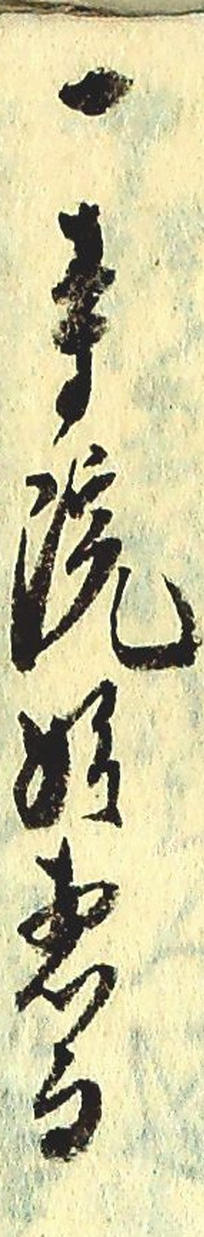一寺院始惣て
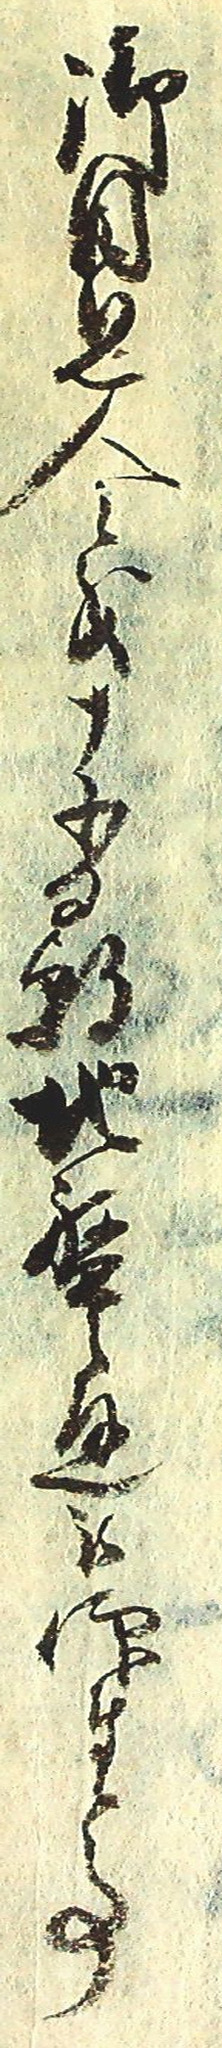御目見人之義十五日朝地盤之通被仰付候事
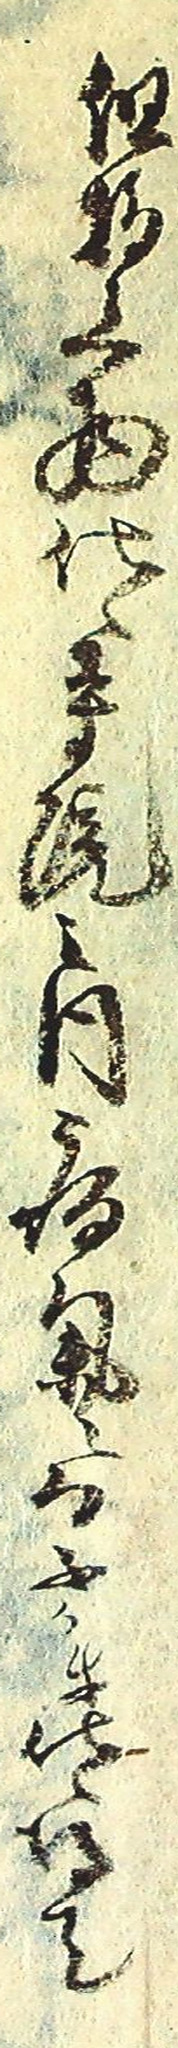但指上物仕候寺院之内病気にて不参仕候得は
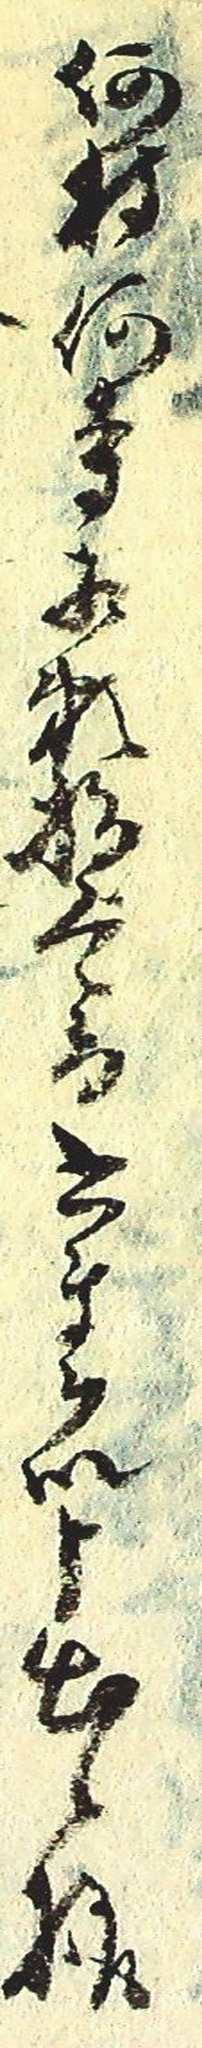何村何寺相頼指上候旨書付を以申出候様
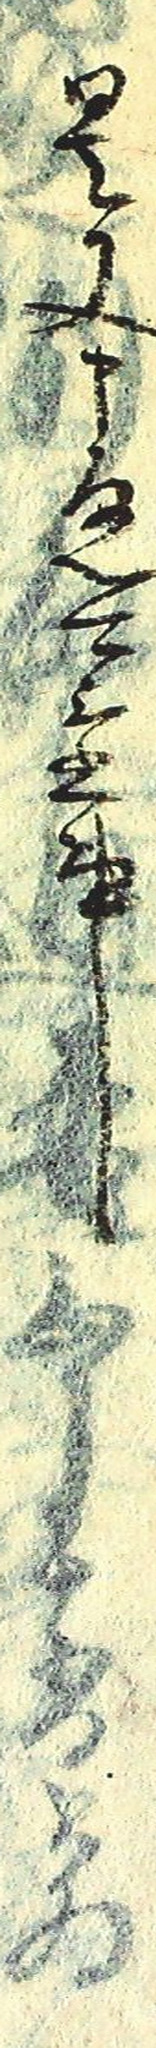是又申通可置事
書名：諸御願書控(弐番）
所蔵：鳴門教育大学 Naruto University of Education
